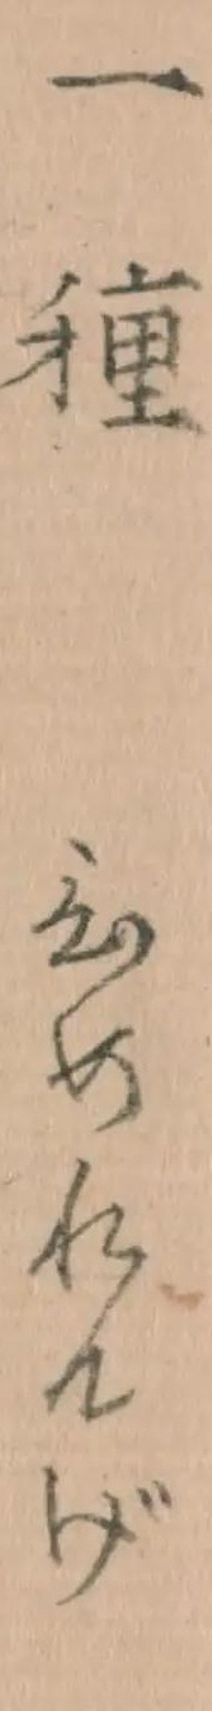一種ひめれんげ
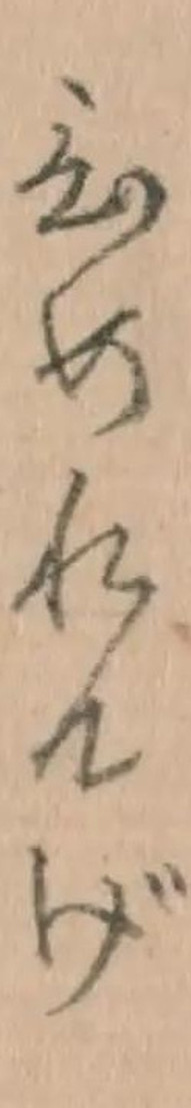ひめれんげ
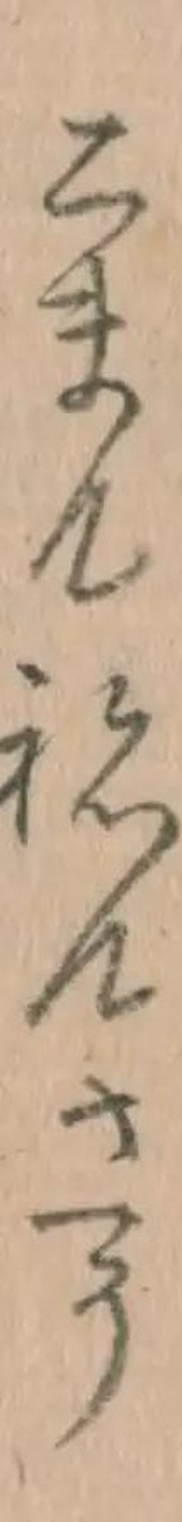こまんねんさう
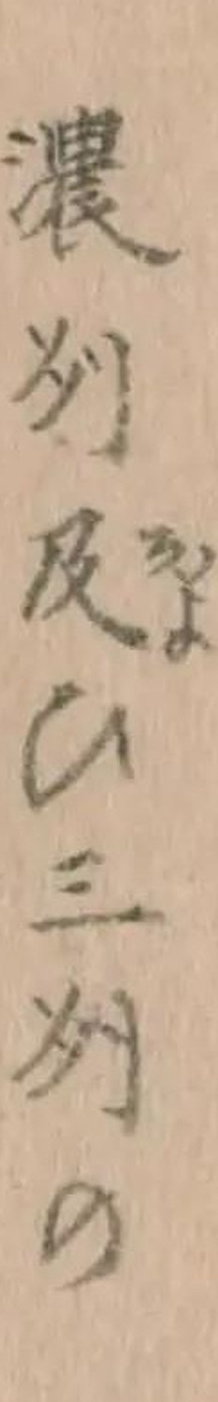濃州及ひ三州の
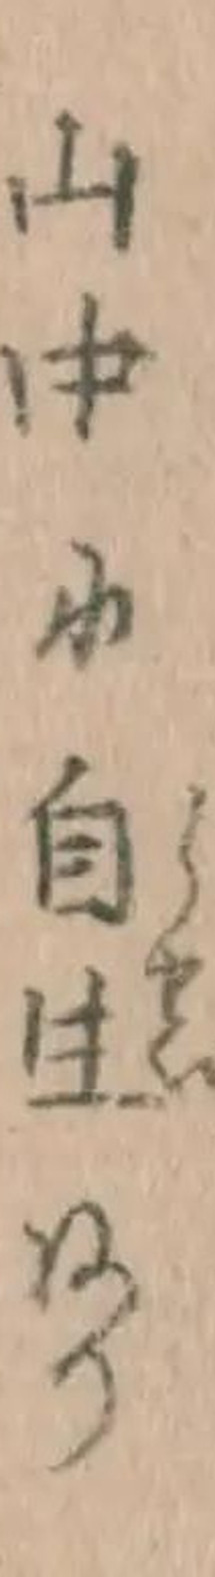山中に自生あり
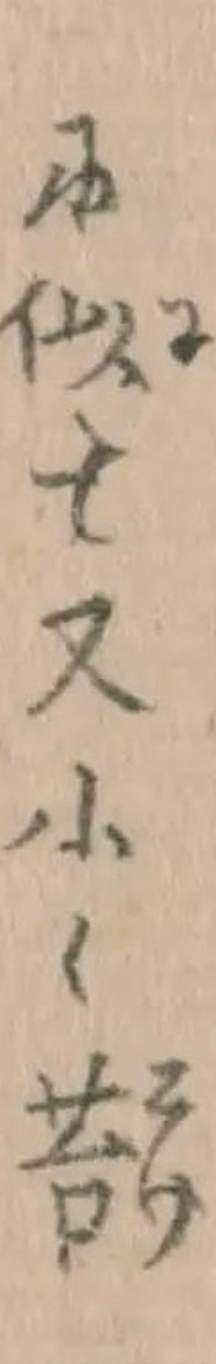に似て又小く苔
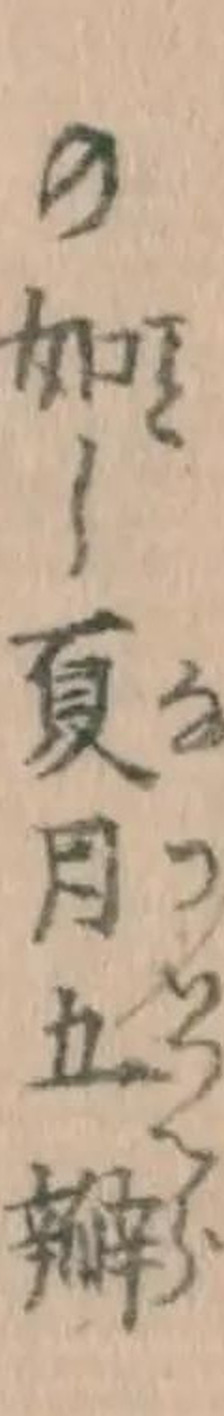の如し夏月五弁
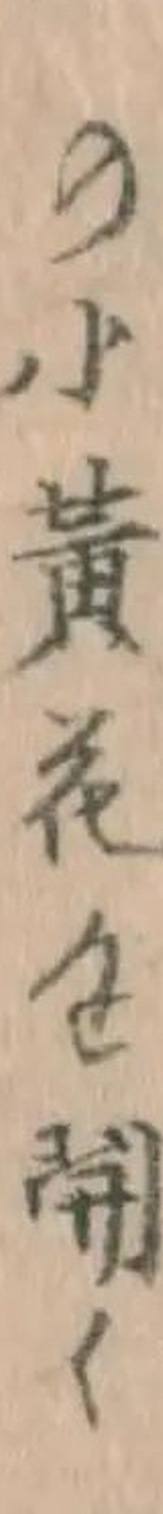の小黄花を開く

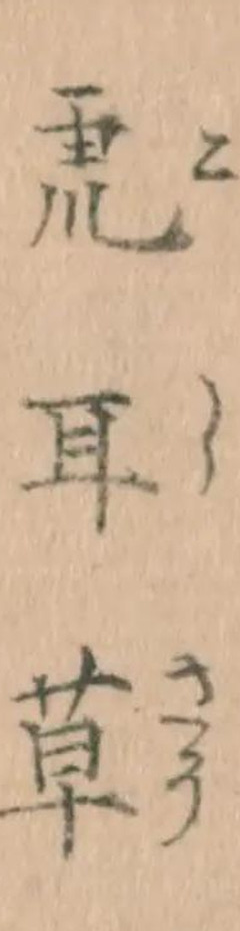虎耳草
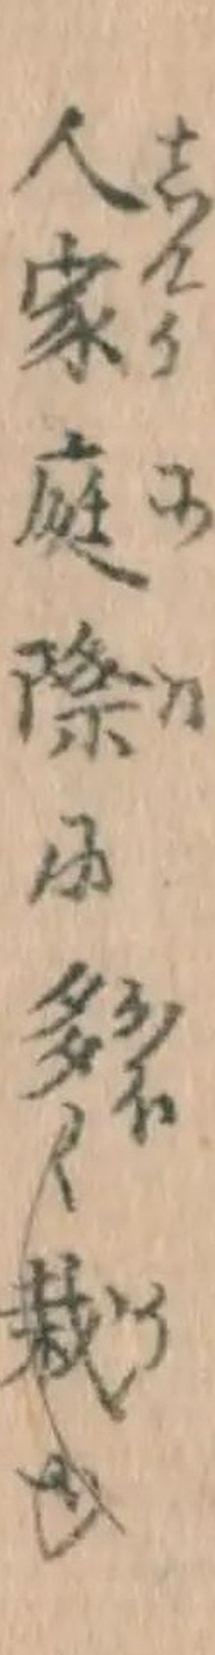人家庭際に多く栽ゆ
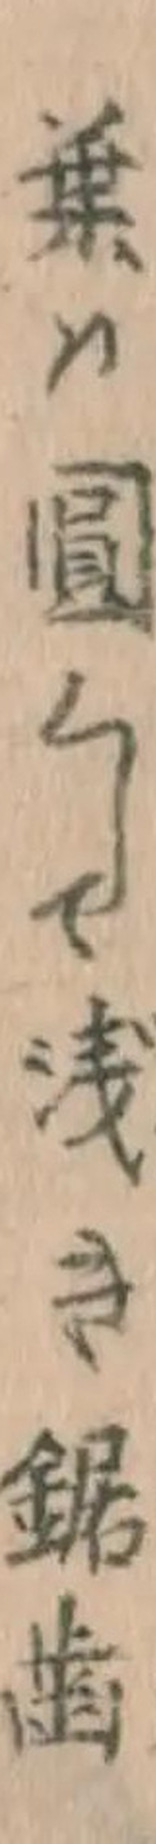葉は円くして浅き鋸歯
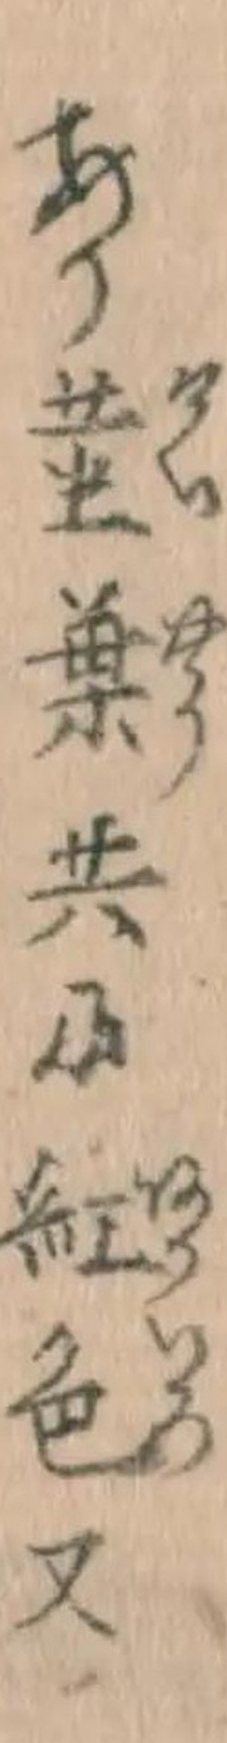あり茎葉共に紅色又
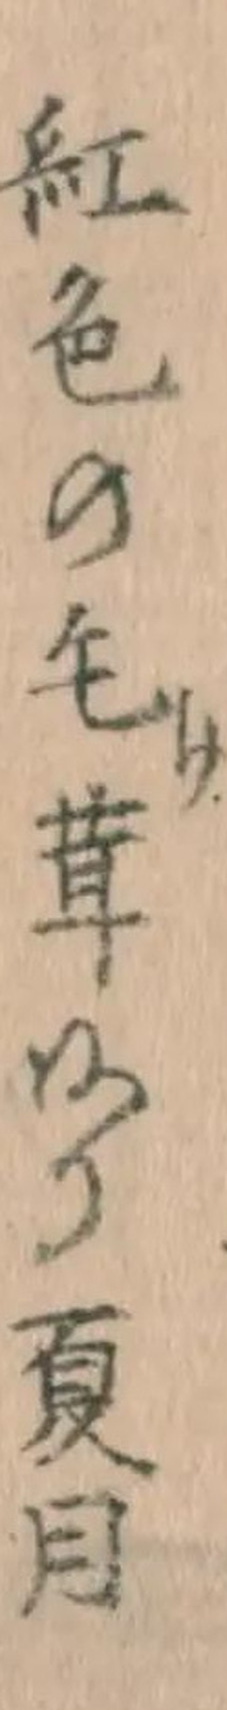紅色の毛茸あり夏月
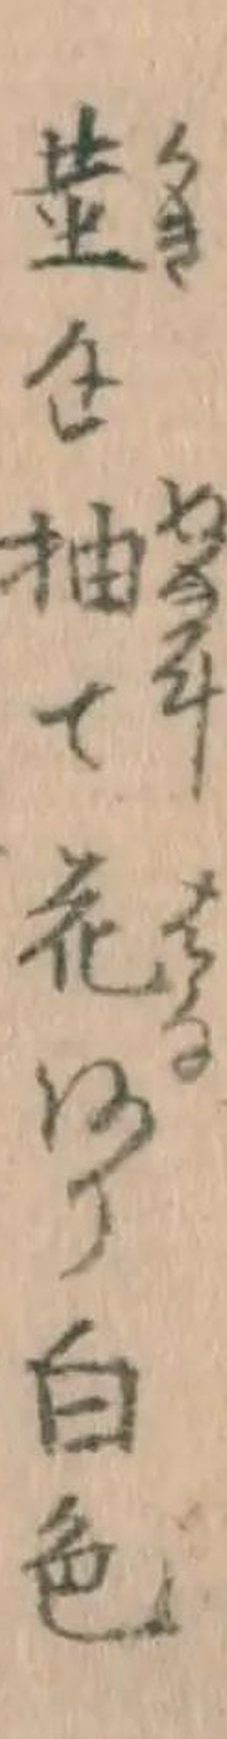茎を抽て花あり白色
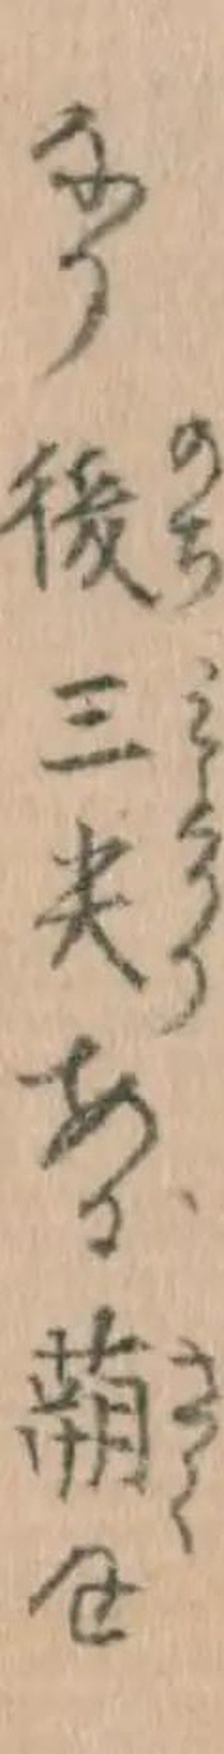なり後三尖ある蒴を
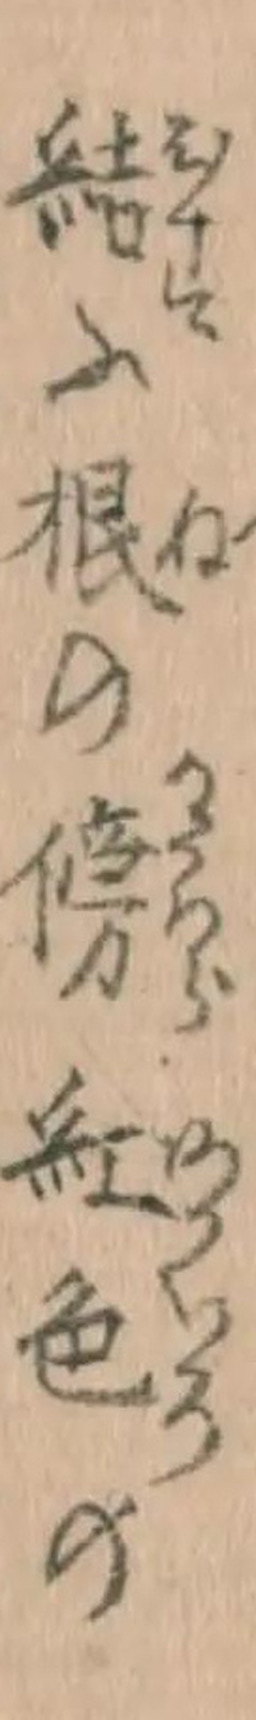結ふ根の傍紅色の
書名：本草図譜. 巻34-36
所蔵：国立国会図書館 National Diet Library, JAPAN
